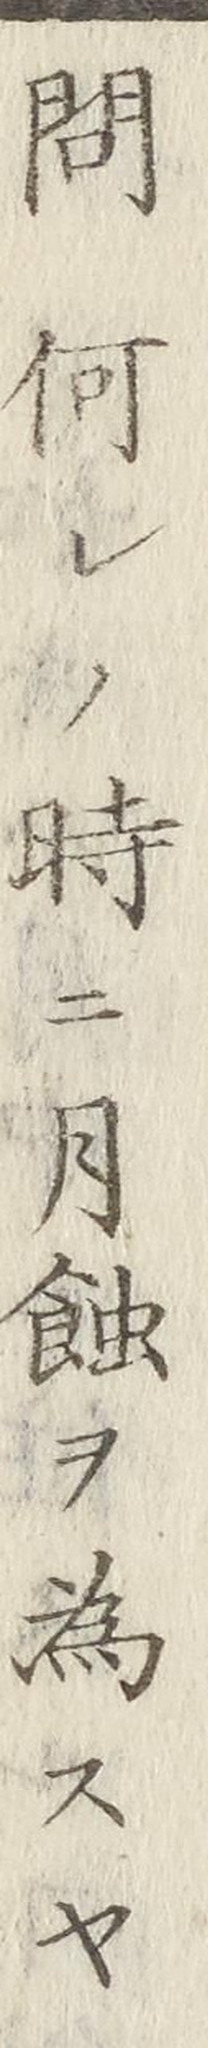問何レノ時ニ月蝕ヲ為スヤ
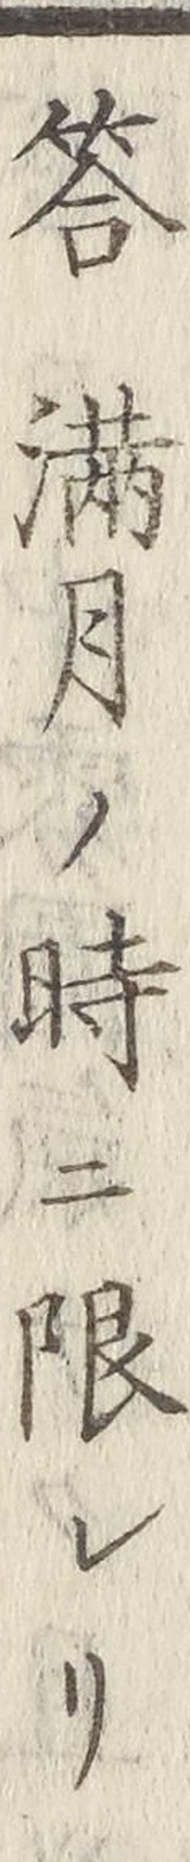答満月ノ時ニ限レリ
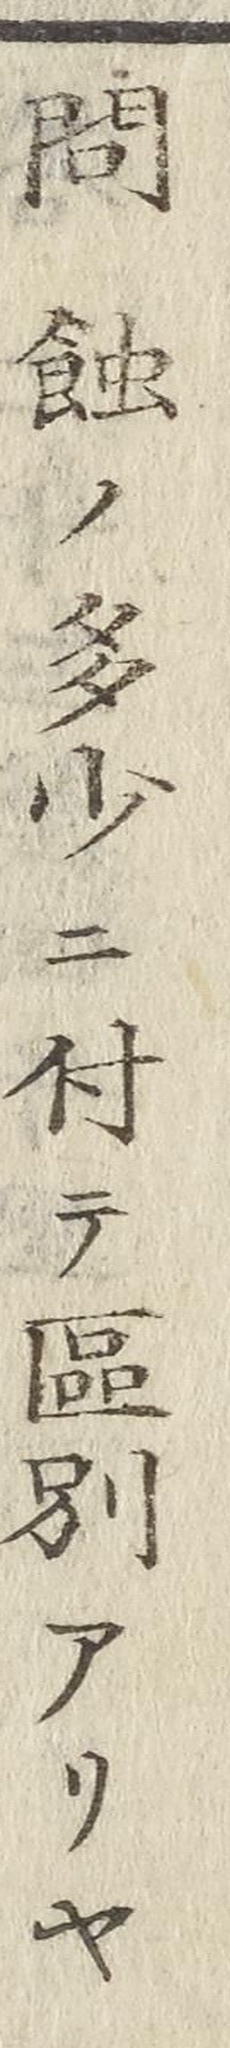問蝕ノ多少ニ付テ区別アリヤ
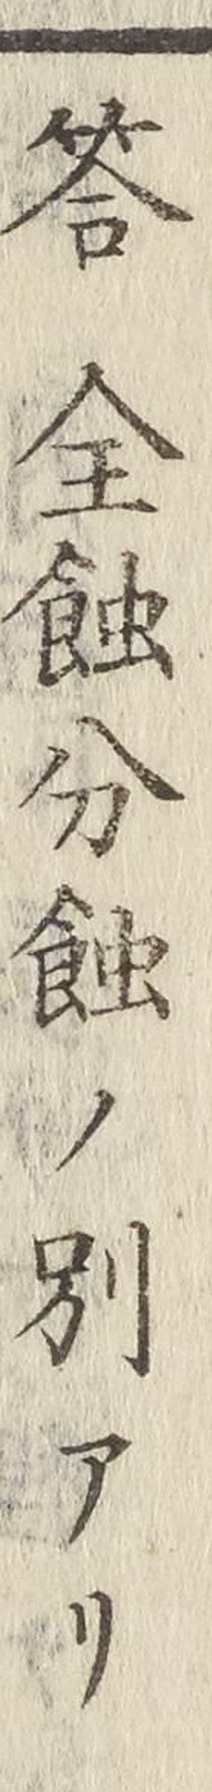答全蝕分蝕ノ別アリ
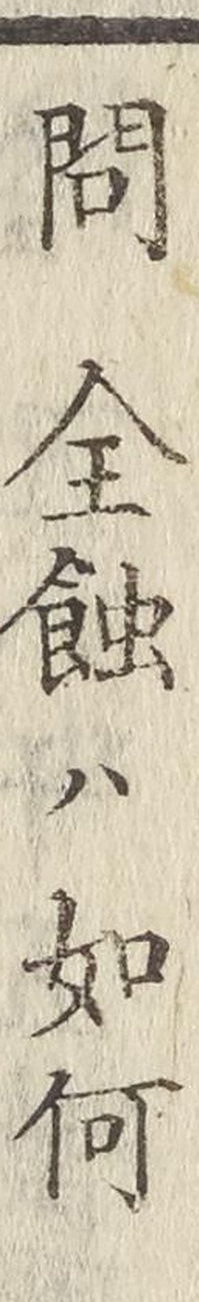問全蝕ハ如何
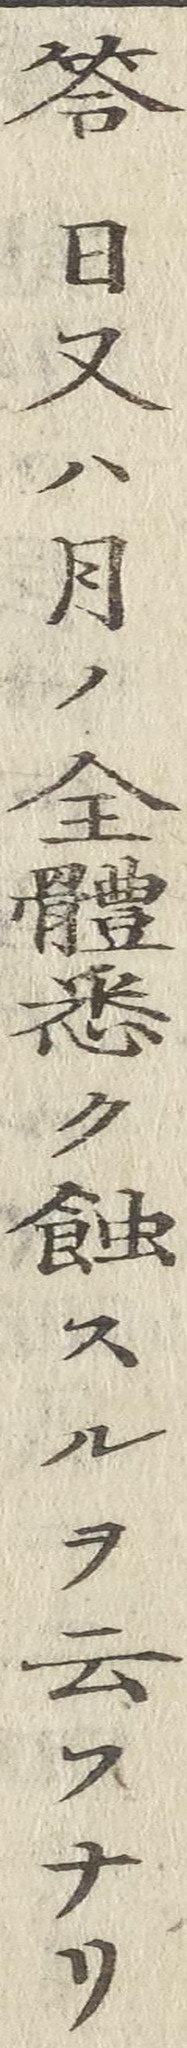答日又ハ月ノ全体悉ク蝕スルヲ云フナリ
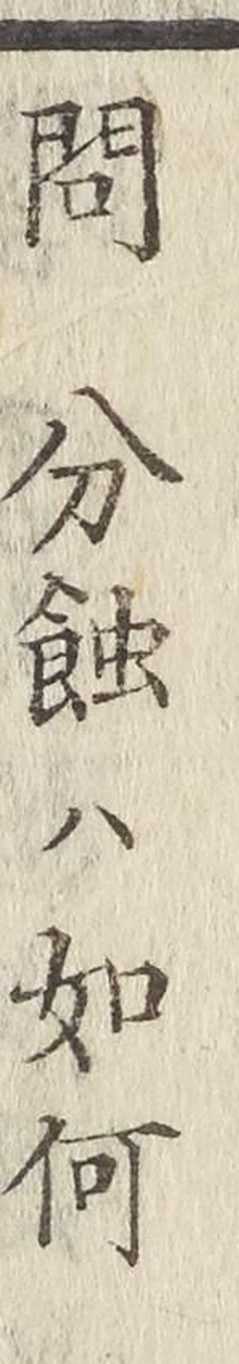問分蝕ハ如何
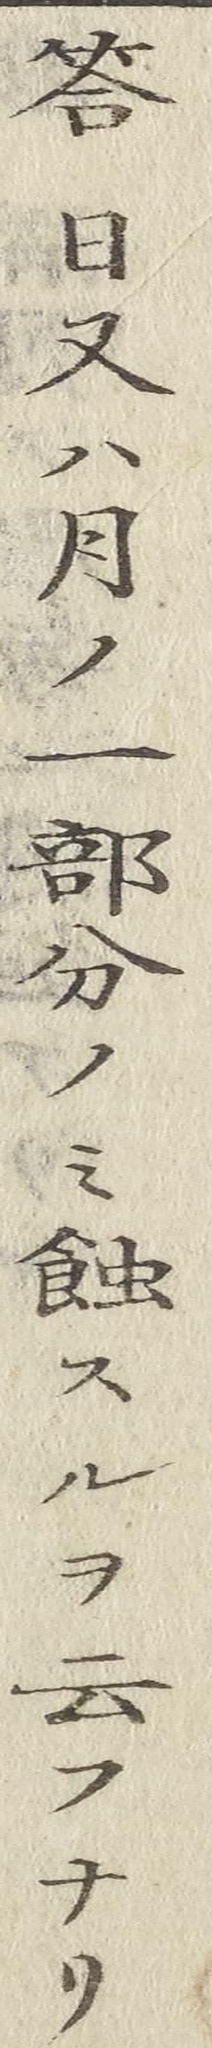答日又ハ月ノ一部分ノミ蝕スルヲ云フナリ
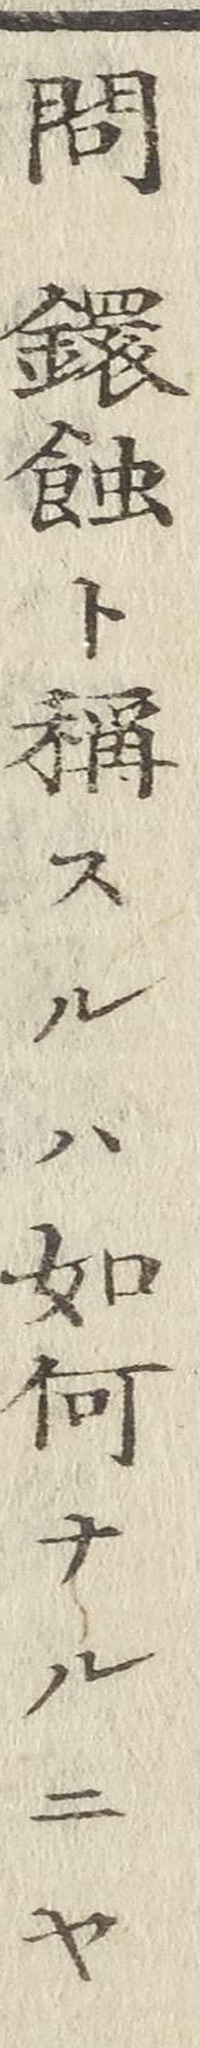問鐶蝕ト称スルハ如何ナルニヤ
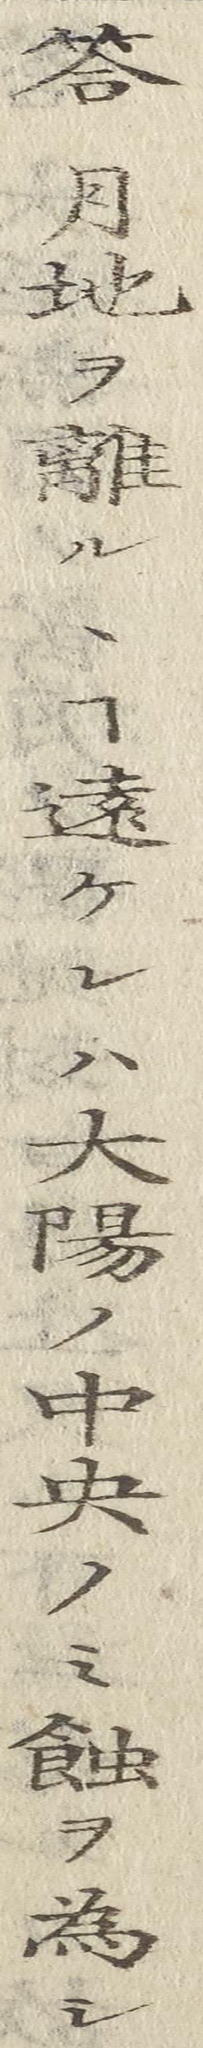答月地ヲ離ルヽコト遠ケレハ大陽ノ中央ノミ蝕ヲ為シ
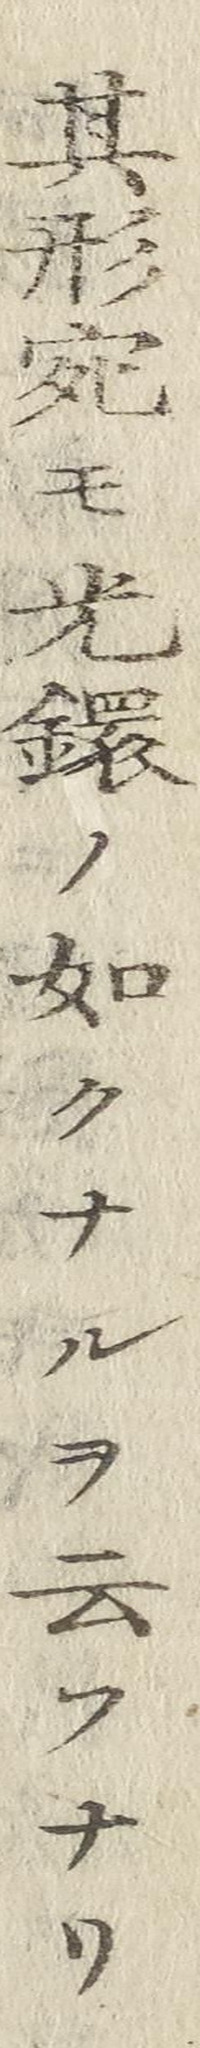其形宛モ光鐶ノ如クナルヲ云フナリ
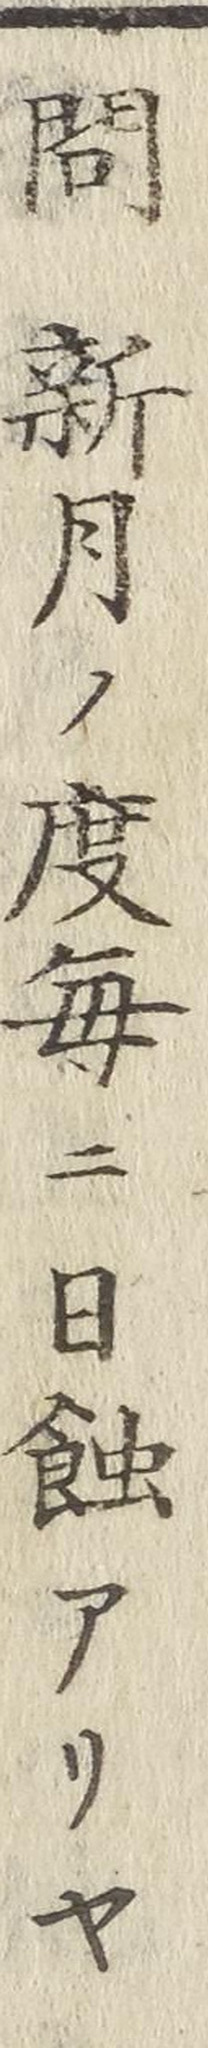問新月ノ度毎ニ日蝕アリヤ

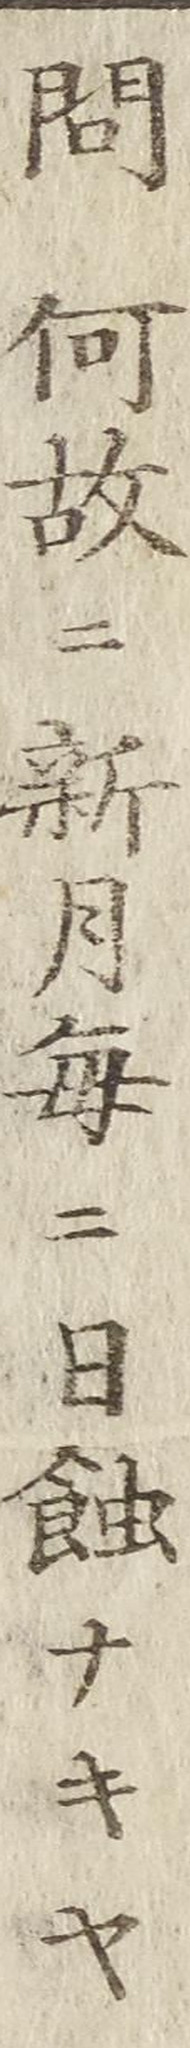問何故ニ新月毎ニ日蝕ナキヤ
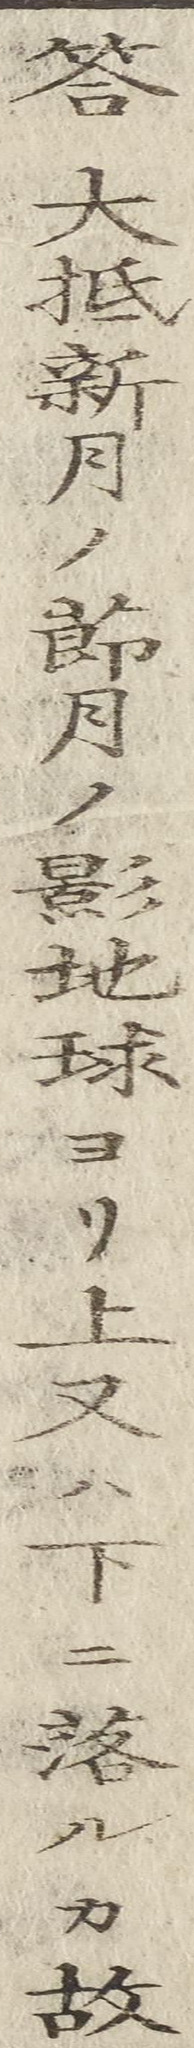答大抵新月ノ節月ノ影地球ヨリ上又ハ下ニ落ルカ故
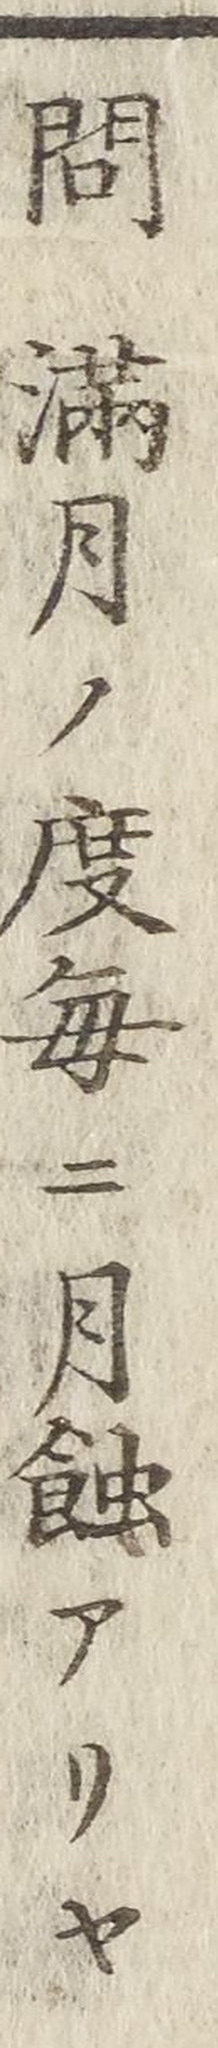問満月ノ度毎ニ月蝕アリヤ
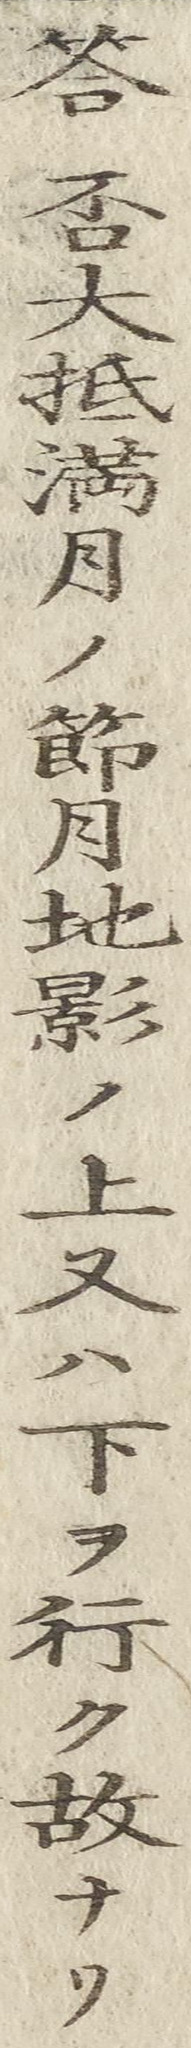答否大抵満月ノ節月地影ノ上又ハ下ヲ行ク故ナリ
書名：星学圖説　下
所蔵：東京大学地震研究所図書室 Earthquake Research Institute Library, The University of Tokyo, JAPAN
